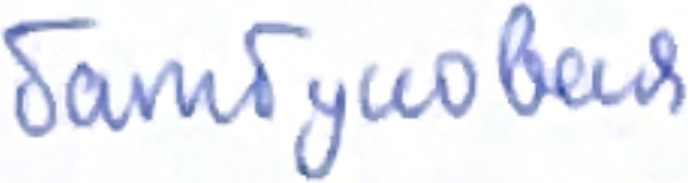бамбуковая
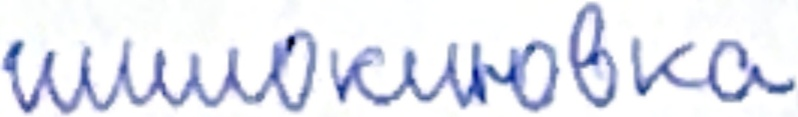шилоклювка
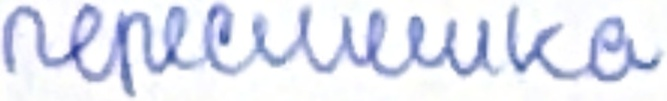пересмешка
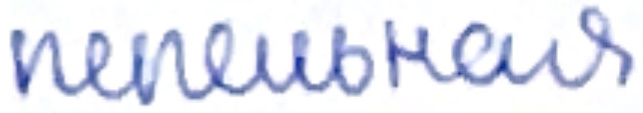пепельная
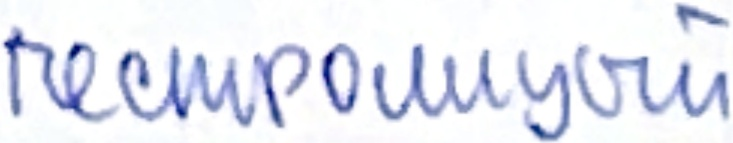пестролицый
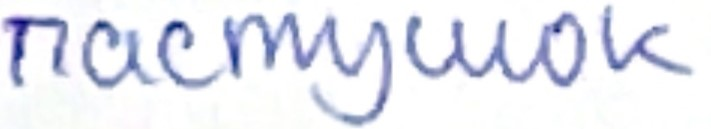пастушок
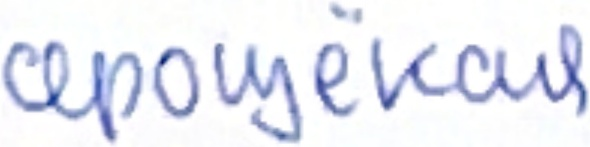серощёкая
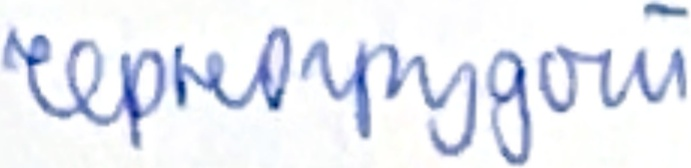черногрудый
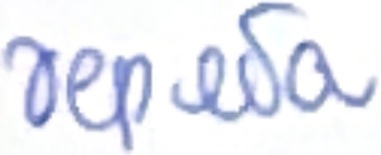деряба
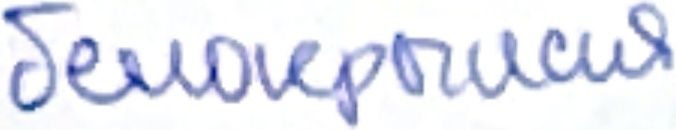белокрылая
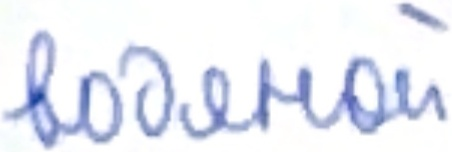водяной
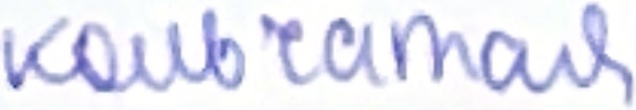кольчатая
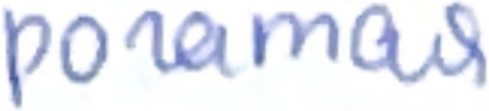рогатая
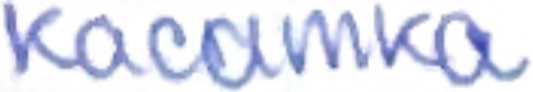касатка
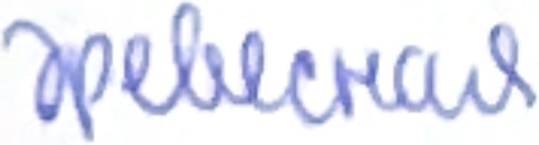древесная
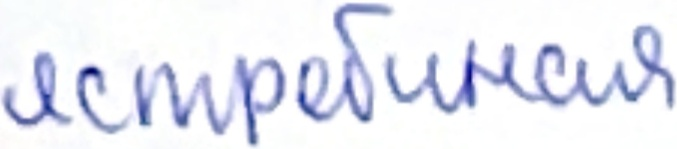ястребиная
